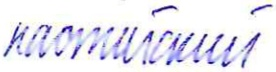каспийский
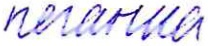пеганка
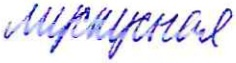мускусная
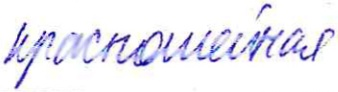красношейная
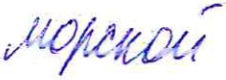морской
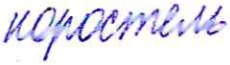коростель
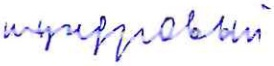тундровый
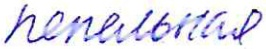пепельная
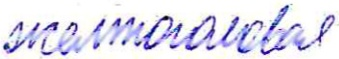желтоголовая
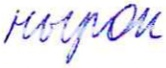нырок
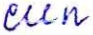сип
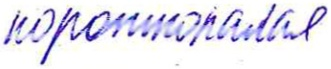короткопалая
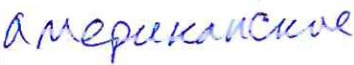американская
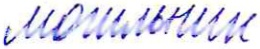могильник
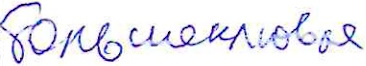большеклювая
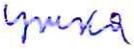утка
